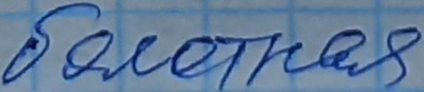болотная
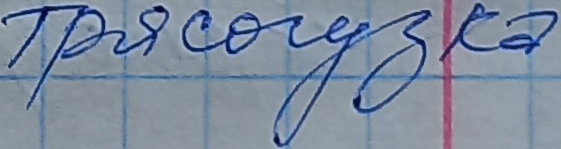трясогузка
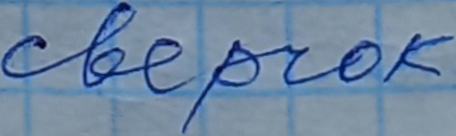сверчок
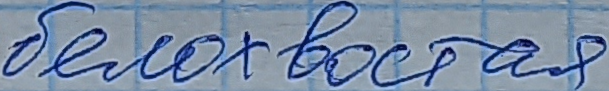белохвостая
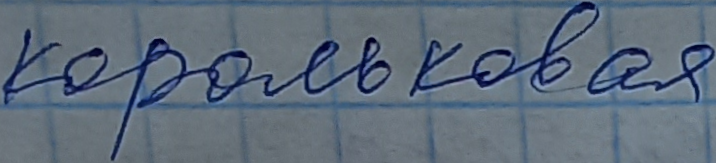корольковая
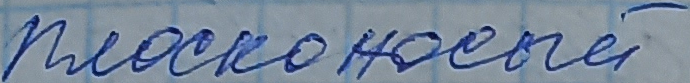плосконосый
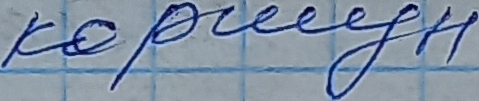коршун
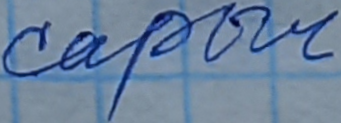сарыч
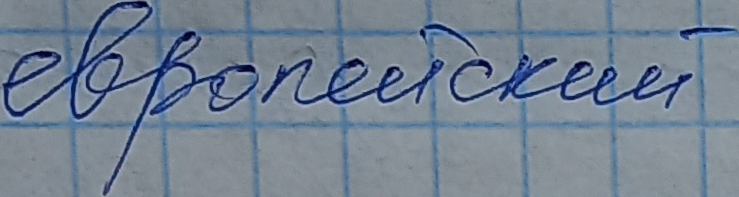европейский
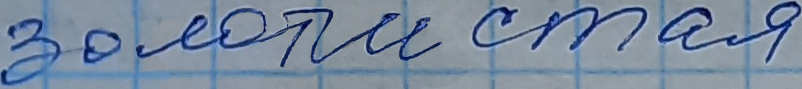золоти стая
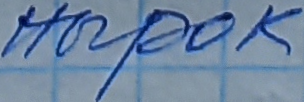нырок
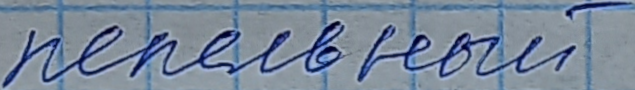пепельный
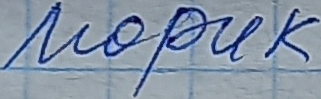люрик
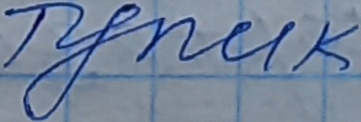тупик
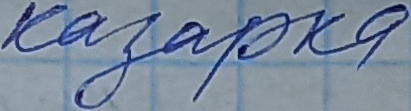казарка
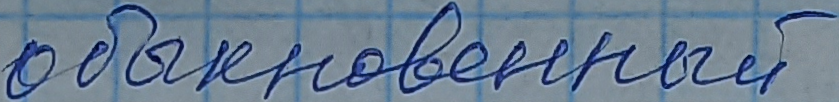обыкновенный
